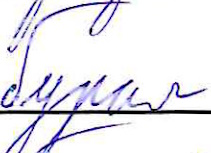бурая
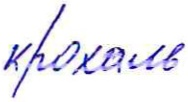крохаль
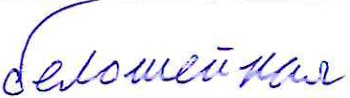белошейная
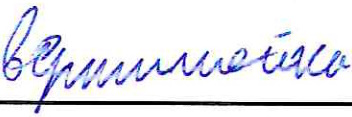вертишейка
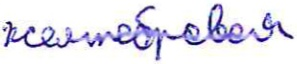желтебревая
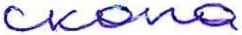скопа
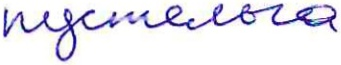пустельга
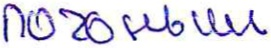погоныш
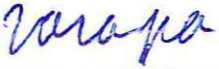гагара
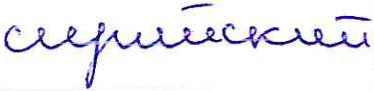сирийский
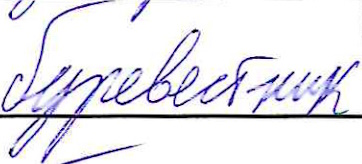буревестник
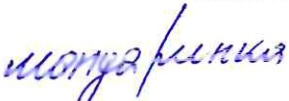мондаринка
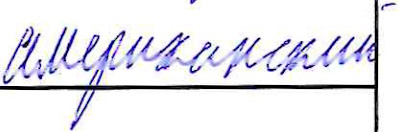американский
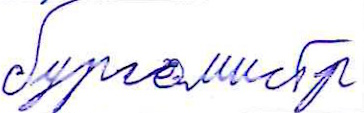бургомистр
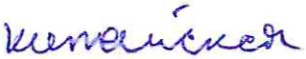кипайскся
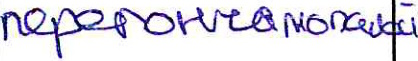перепончатопалый
